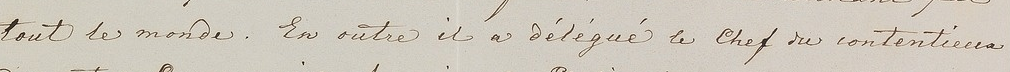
tout le monde. En outre il a délégué le Chef du contentieux
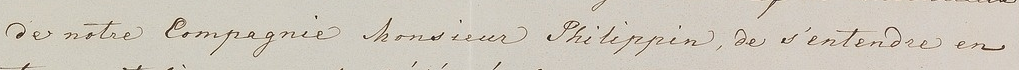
de notre Compagnie Monsieur Philippin, de s'entendre en
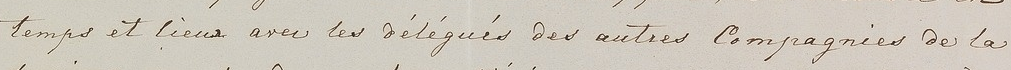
temps et lieux avec les délégués des autres Compagnies de la
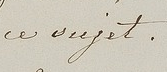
ce sujet. –
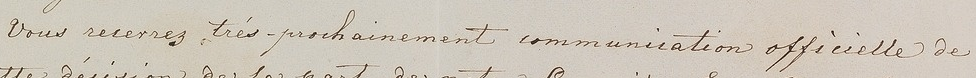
Vous recevrez très prochainement communication officielle de
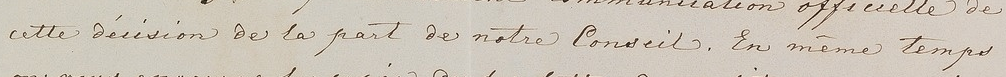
cette décision de la part de notre Conseil. En même temps
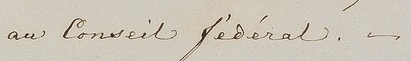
au Conseil fédéral. –
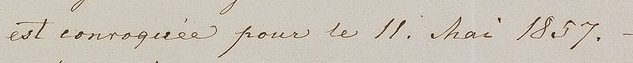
est convoquée pour le 11. Mai 1857. –
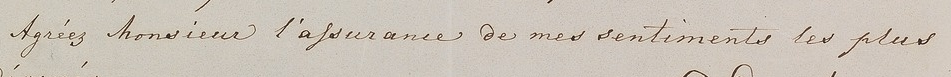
Agréez Monsieur l'assurance de mes sentiments les plus
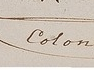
Colonel.
